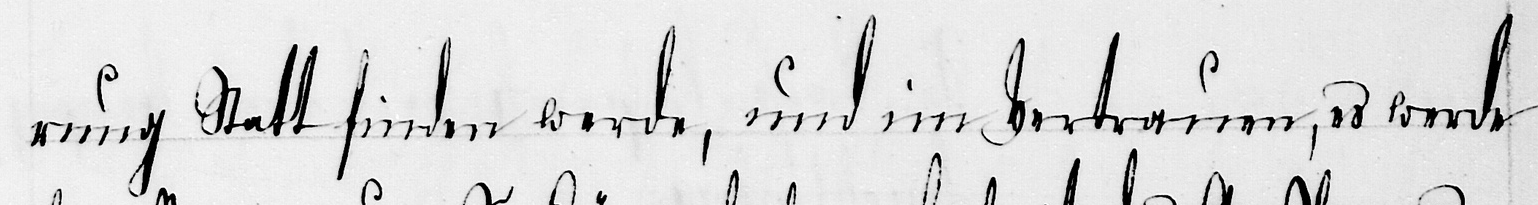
rung Statt finden werde, und im Vertrauen, es werde
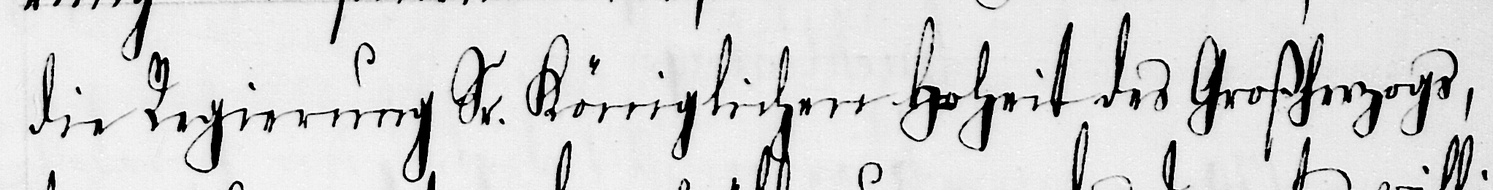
die Regierung Sr. Königlichen Hoheit des Großherzogs,
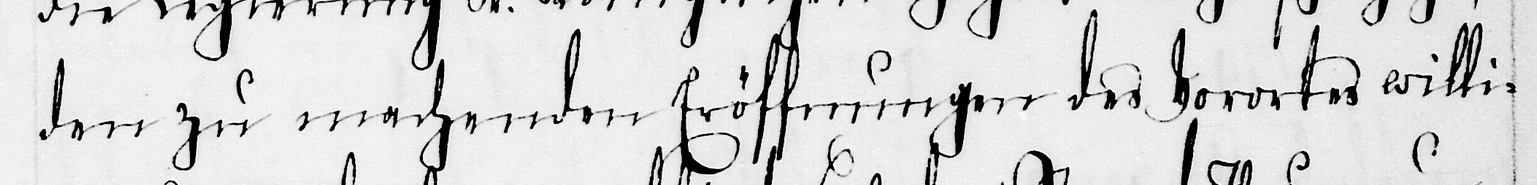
den zu machenden Eröffnungen des Vorortes willi¬
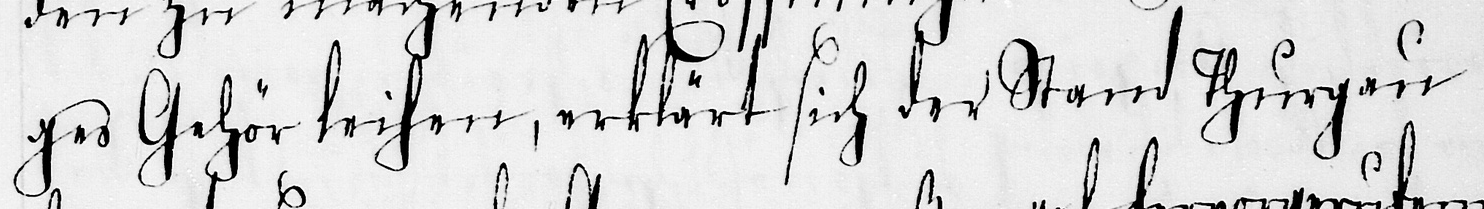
ges Gehör leihen, erklärt sich der Stand Thurgau
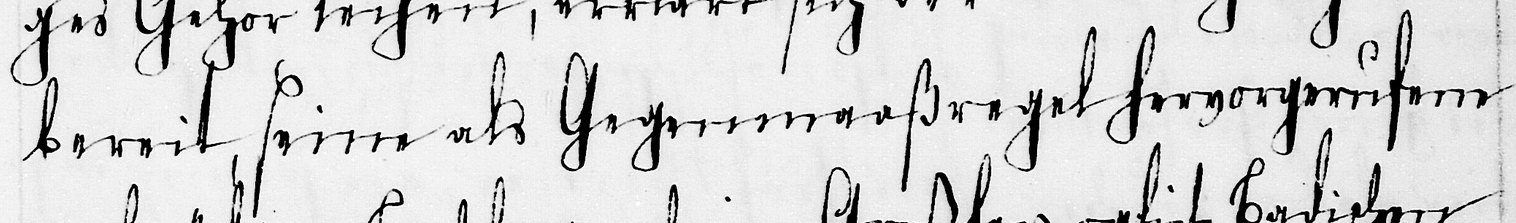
bereit, seine als Gegenmaaßregel hervorgerufene
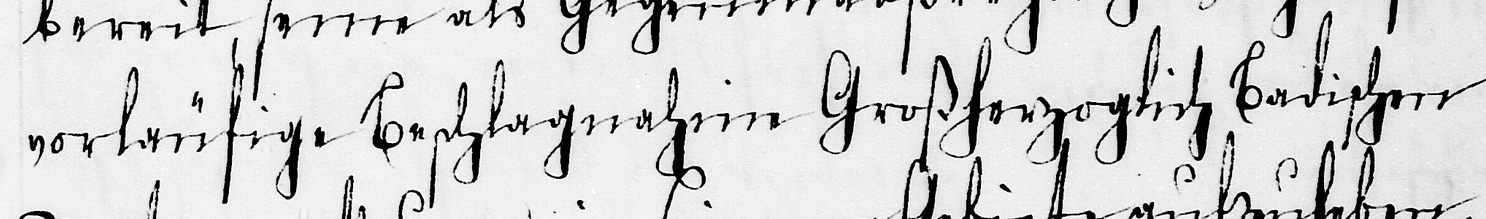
vorläufige Beschlagnahme Großherzoglich Badischen
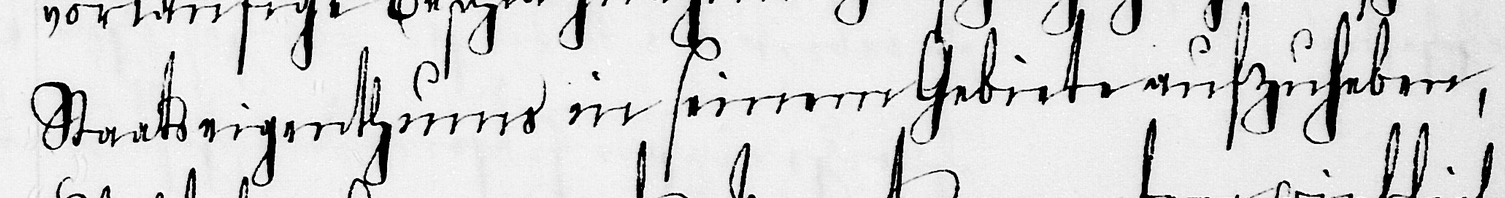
Staatseigenthums in seinem Gebiete aufzuheben,
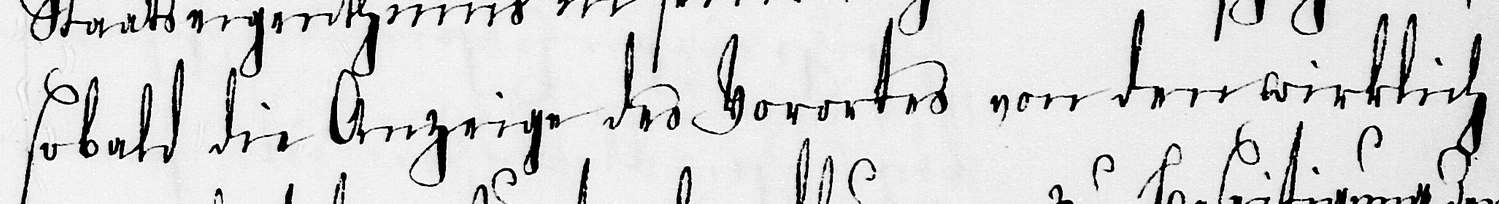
sobald die Anzeige des Vorortes von den wirklich
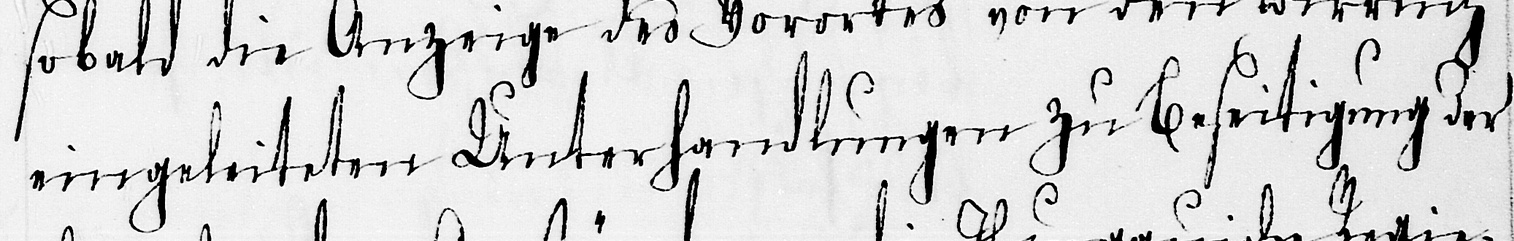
eingeleiteten Unterhandlungen zu Beseitigung der
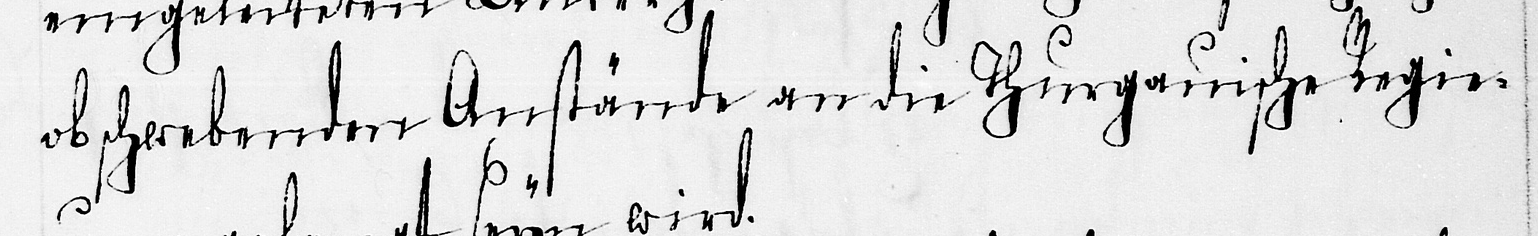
obschwebenden Anstände an die Thurgauische Regie¬
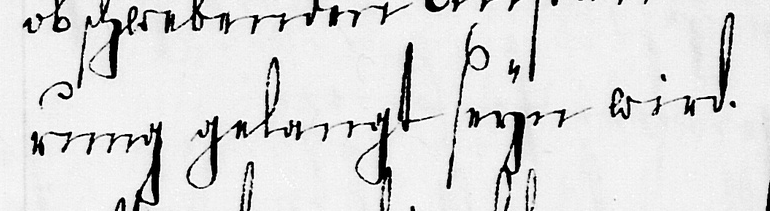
rung gelangt seyn wird.
